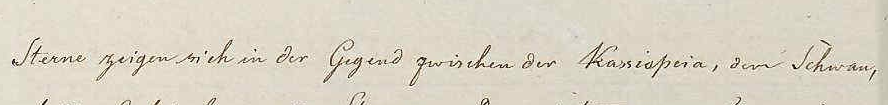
Sterne zeigen sich in der Gegend zwischen der Kassiopeia, dem Schwan,
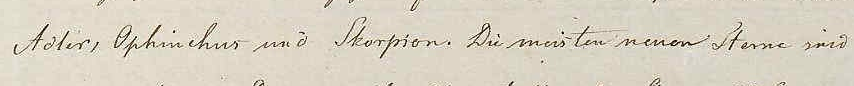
Adler, Ophiuchus und Skorpion. Die meisten neuen Sterne sind
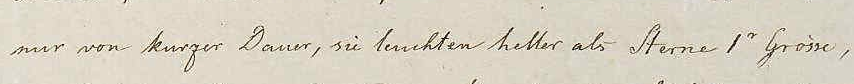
nur von kurzer Dauer, sie leuchten heller als Sterne 1￼ Grösse,
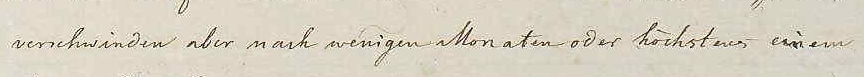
verschwinden aber nach wenigen Monaten oder höchstens einem
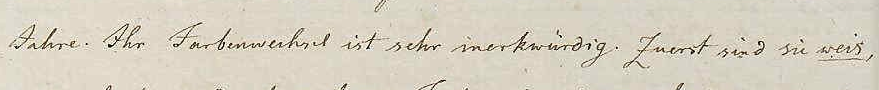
Jahre. Ihr Farbenwechsel ist sehr merkwürdig. Zuerst sind sie weis,
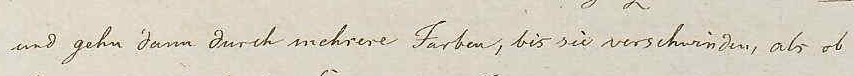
und gehn dann durch mehrere Farben, bis sie verschwinden, als ob
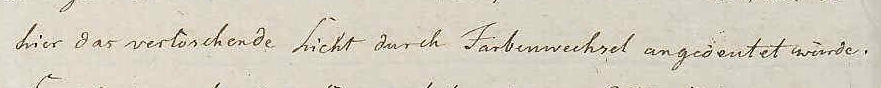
hier das verlöschende Licht durch Farbenwechsel angedeutet würde.
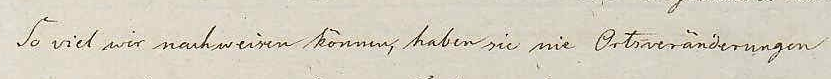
So viel wir nachweisen können, haben sie nie Ortsveränderungen
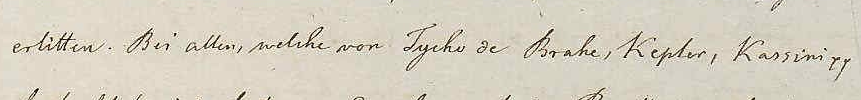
erlitten. Bei allen, welche von Tycho de Brahe, Kepler, Kassini pp
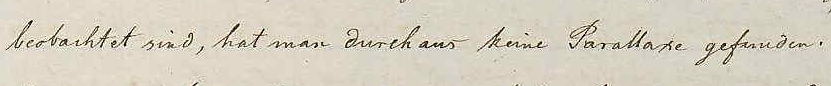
beobachtet sind, hat man durchaus keine Parallaxe gefunden.
